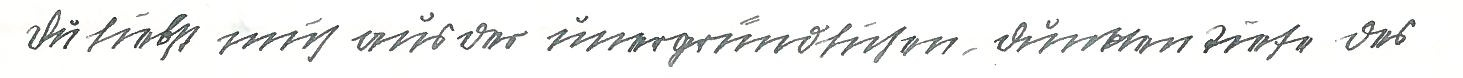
Du liebst mich aus der unergründlichen, dunklen Tiefe des
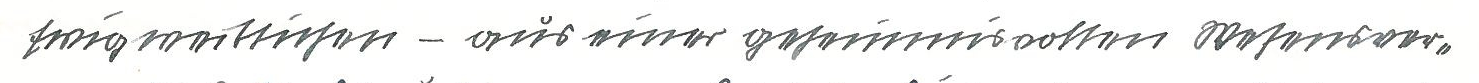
Ewigweiblichen – aus einer geheimnisvollen Wesensver¬
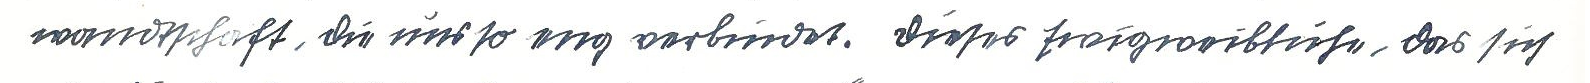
wandtschaft, die uns so eng verbindet. Dieses Ewigweibliche, das sich
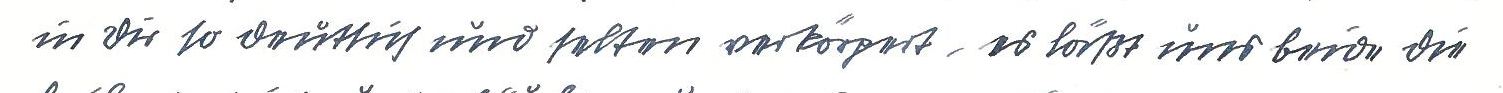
in Dir so deutlich und selten verkörpert, es läßt uns beide die
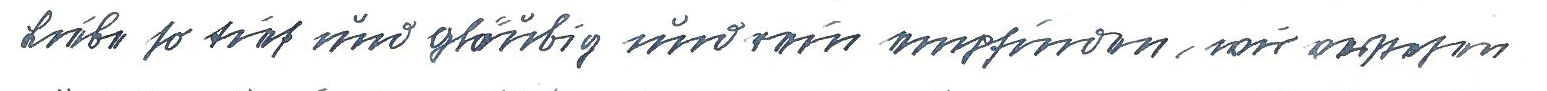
Liebe so tief und gläubig und rein empfinden, wir verstehen
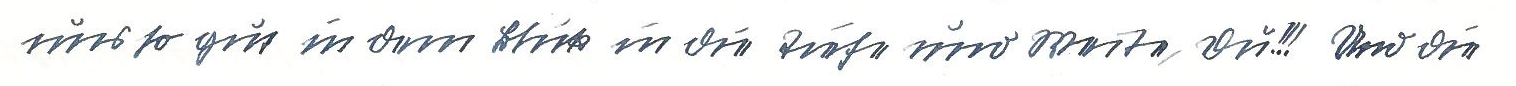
uns so gut in dem Blick in die Tiefe und Weite, Du!!! Und die
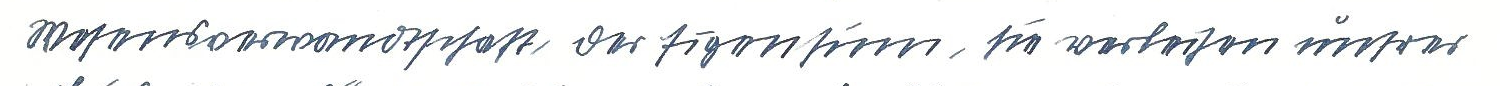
Wesensverwandtschaft, der Eigensinn, sie verleihen unsrer
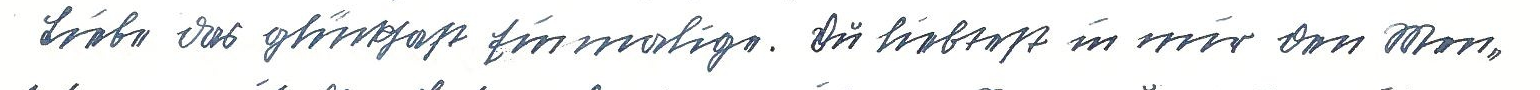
Liebe das glückhaft Einmalige. Du liebtest in mir den Men¬
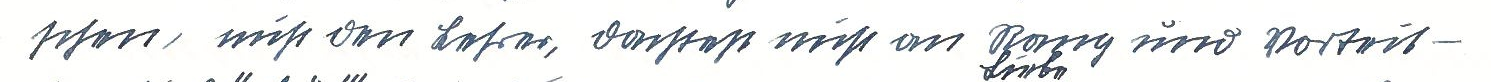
schen, nicht den Lehrer, dachtest nicht an Rang und Vorteil –
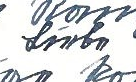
Liebe
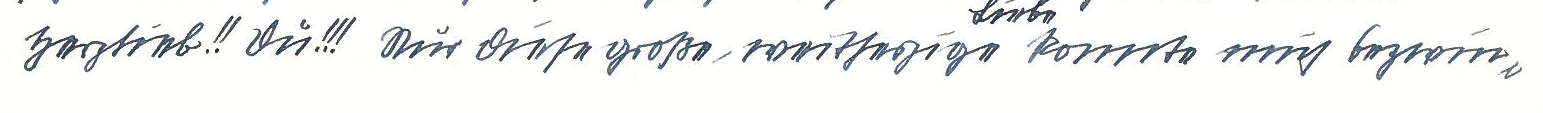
Herzlieb!! Du!! Nur diese große, weitherzige konnte mich bezwing-
